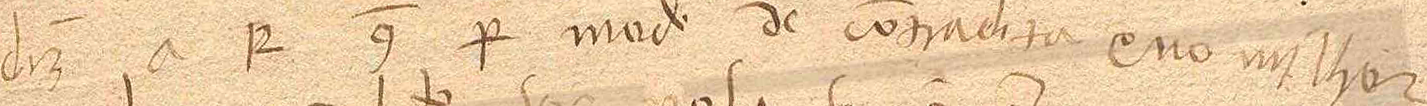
diz a R q̄ ꝑ modo de cōtradita e no mjlhor
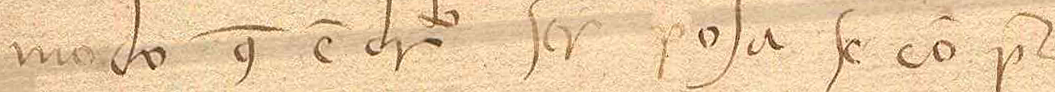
modo q̄ ē drto ser posa se cōpr
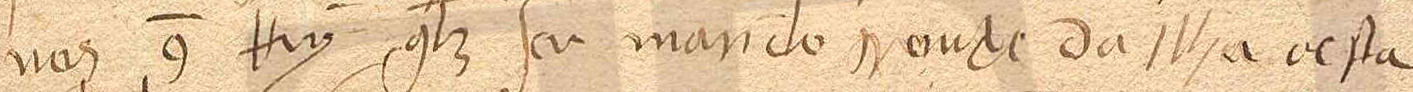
nos q̄ Ruy ḡlz seu marido trouxe da Ilha a esta
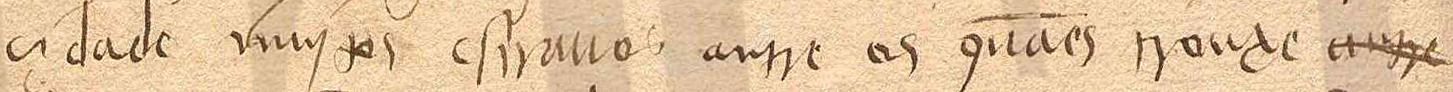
çidade mujtos escrauos antre os qūaes trouxe antre
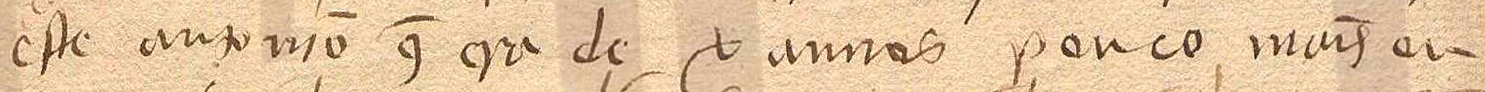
este antonio q̄ era de x annos pouco mais ou
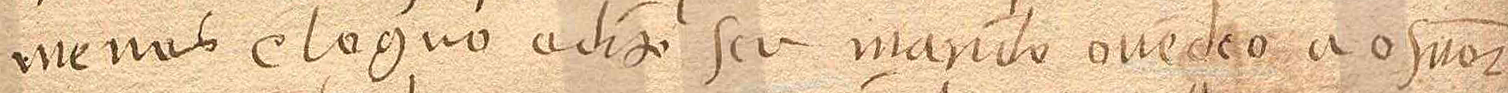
menos e loguo o dito seu marido o uēdeo ao snōr
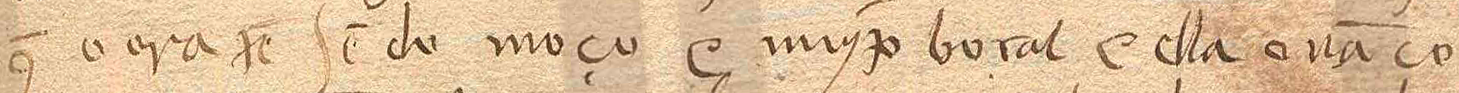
q̄ o ora tē sēdo moço e mujto bocal e ella o nā co
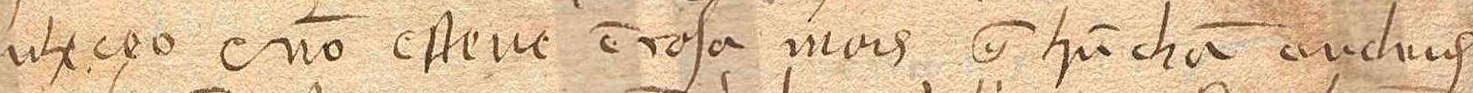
nheçeo e nō esteue ē casa mais q̄ hū dia ou dous
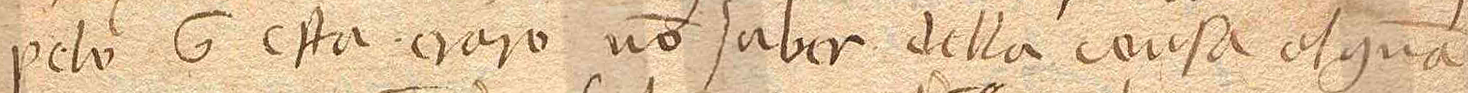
pelo q̄ esta craro nō saber della cousa algūa
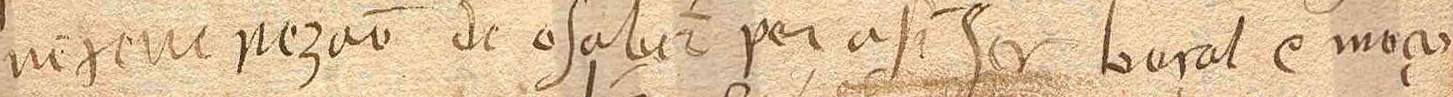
nē tem rrezaõ de o saber̄ por asi ser boçal e moço
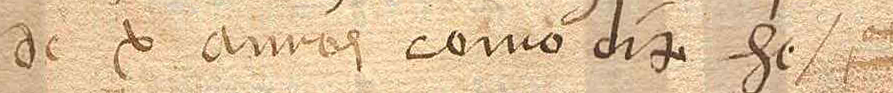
de x annos como dito he /
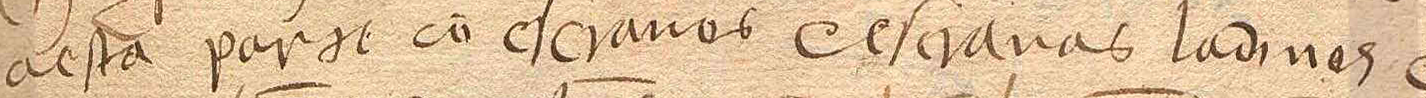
a esta parte cō escrauos e escrauas ladinos e
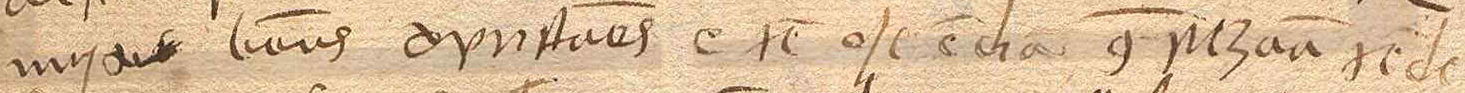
mujtos bōns xpristãos e tē oJe ē dia q̄ rrezaā tē de
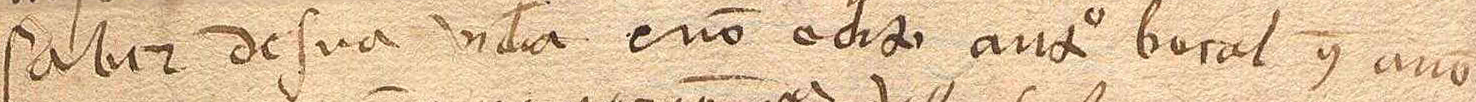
saber de sua vida e nō o dito anto bocal q̄ a nō
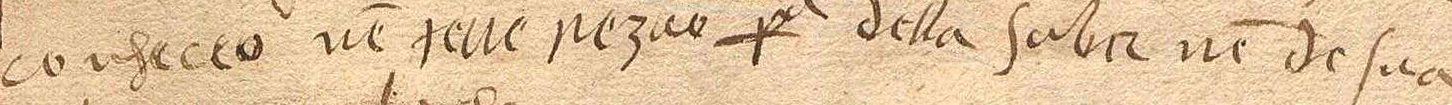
conheceo nē teue rrezão ꝑa della saber nē de sua
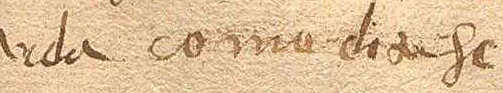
vida como dito he
